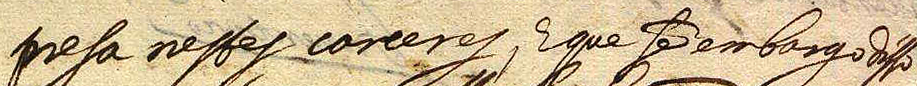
presa nestes carceres, E que sē embargo disso
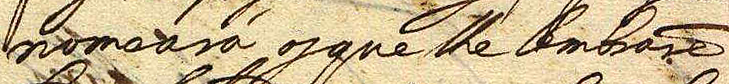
nomeará os que lhe lembrarē
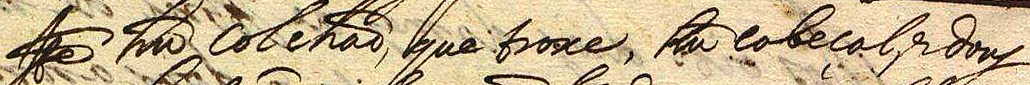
Jtē hū colchaõ, que troxe, hū cabeçal, E dous
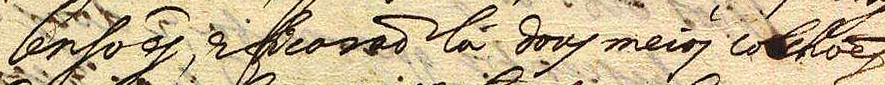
lensoẽs, E ficaraõ lá dous meios colchoẽs
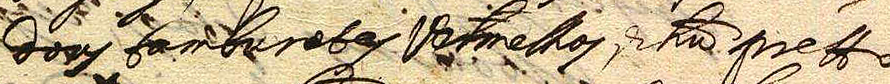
dous tamburetes vermelhos, E hū pretto
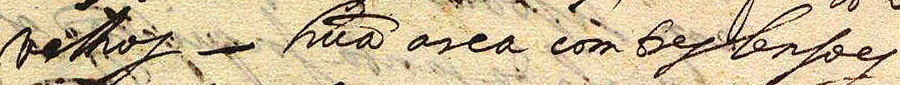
velhos - huā arca com tres lensoes
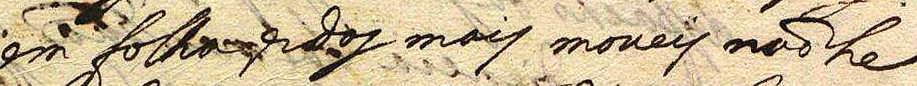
em folha, E dos mais moueis naõ he
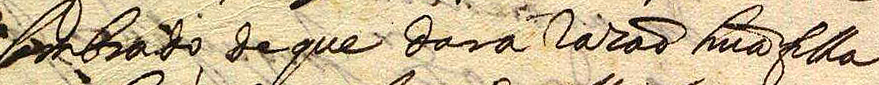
lembrado, de que dará razão huā filha
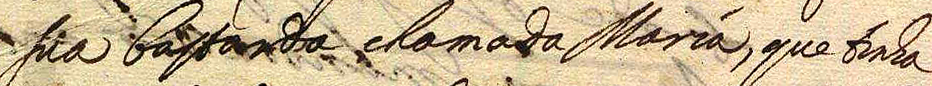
sua bastarda chamada María, que tinha
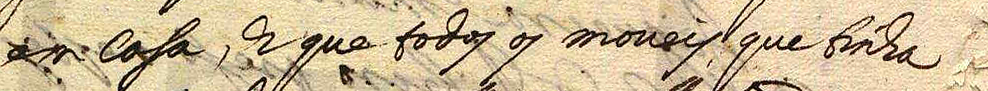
em casa, E que todos os moueis, que tinha
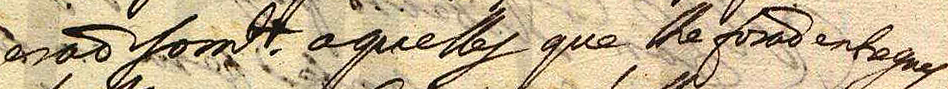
eraõ somte. aquelles que lhe forão entregues
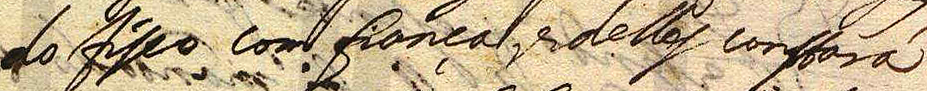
do fisco com fiança, e delles constará
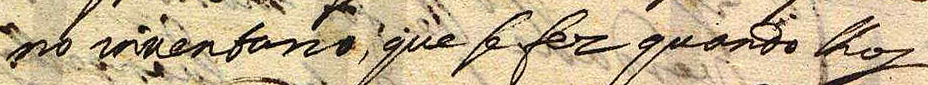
no inuentario, que se fez quando lhos
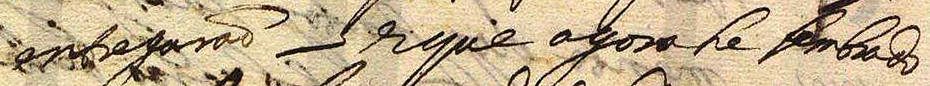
entregaraõ - E que agora he lembrado
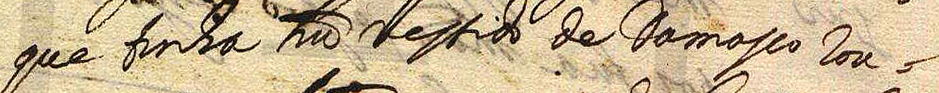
que tinha hū vestido de Damasco Rou
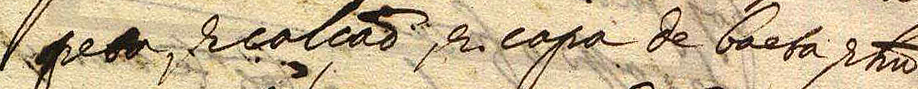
peta, E calçaõ, E capa de baeta, E hū
